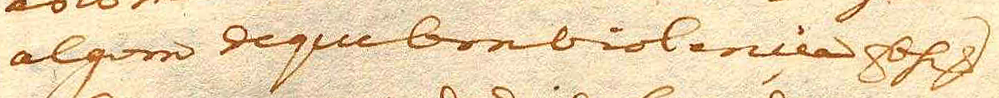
algum de que com violencia fossaõ
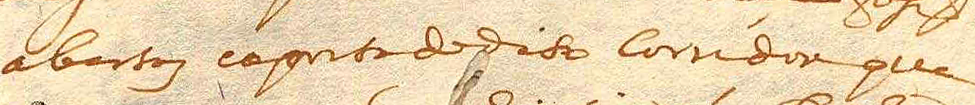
abertos e a porta do dito corredor que
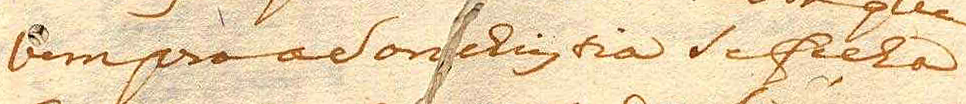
vem pra a San_christia se fecha
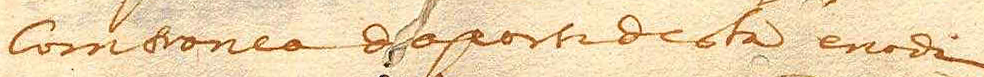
com tranca da porta desta e no di
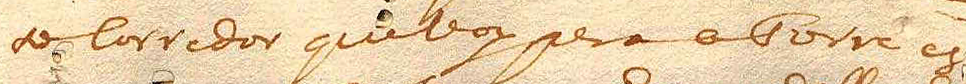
to corredor que vay pera o Torre es
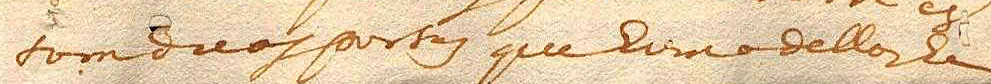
tam duas portas que huma dellas he
